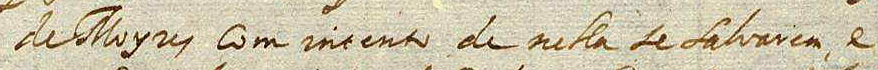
de Moyzes com intento de nella se salvarem, e
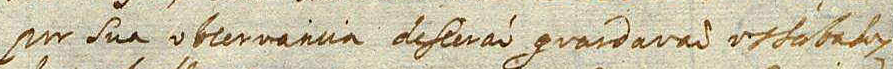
por sua observancia disseraõ guardavaõ os sabados
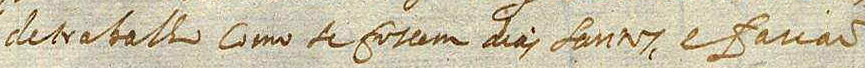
de trabalho Como se fossem dias santos, e faziaõ
